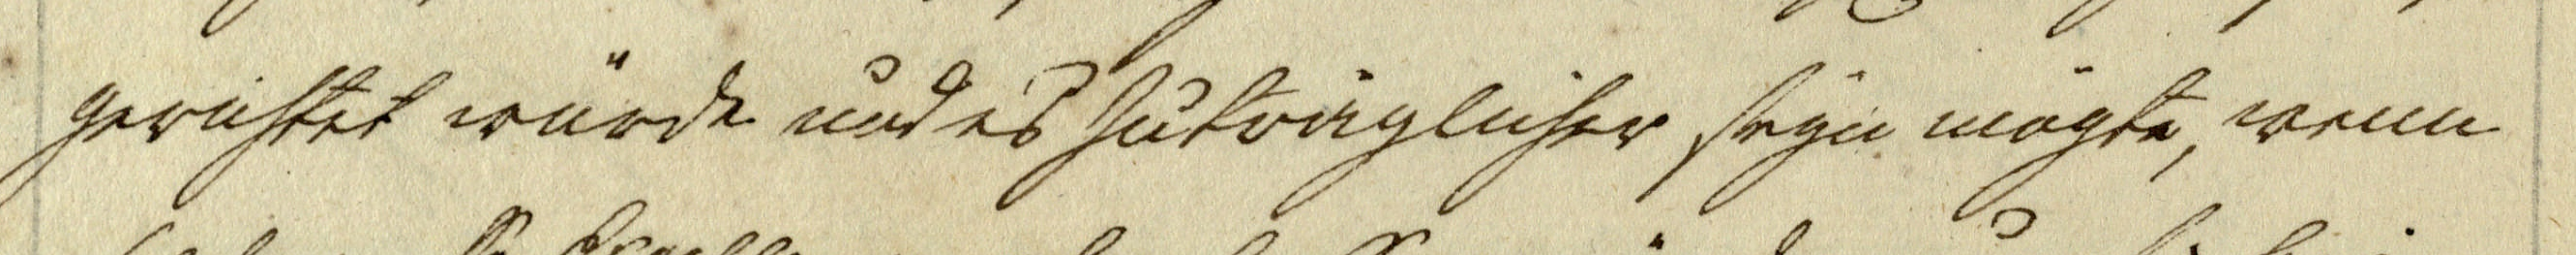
gerichtet würde und es zuträglicher seÿn mögte, wenn
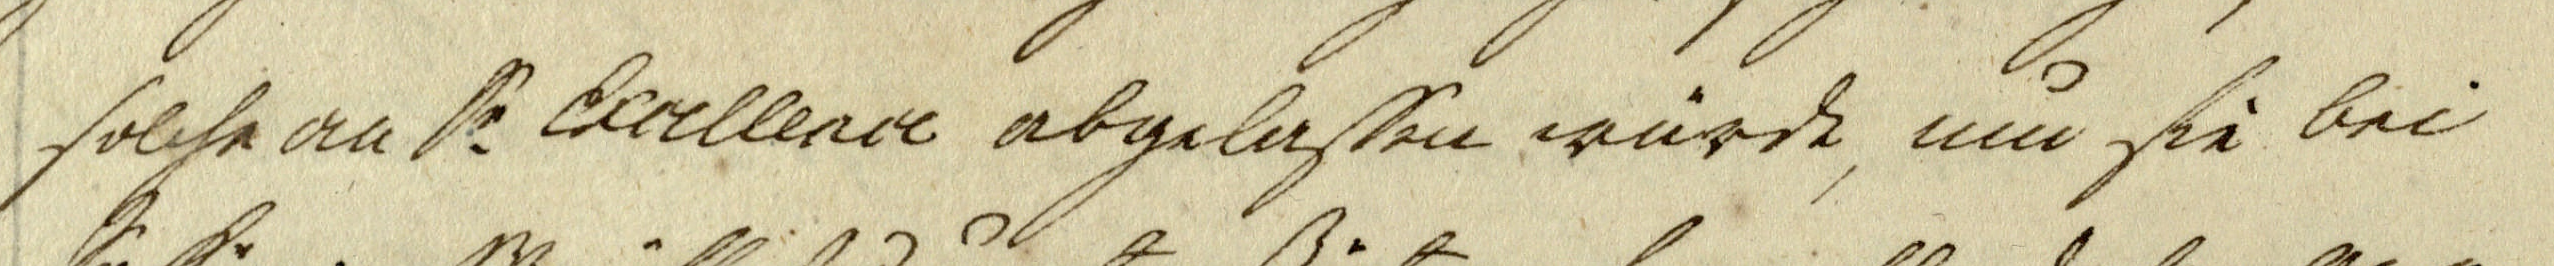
solche an Sr Excellence abgelassen würde, um sie bei
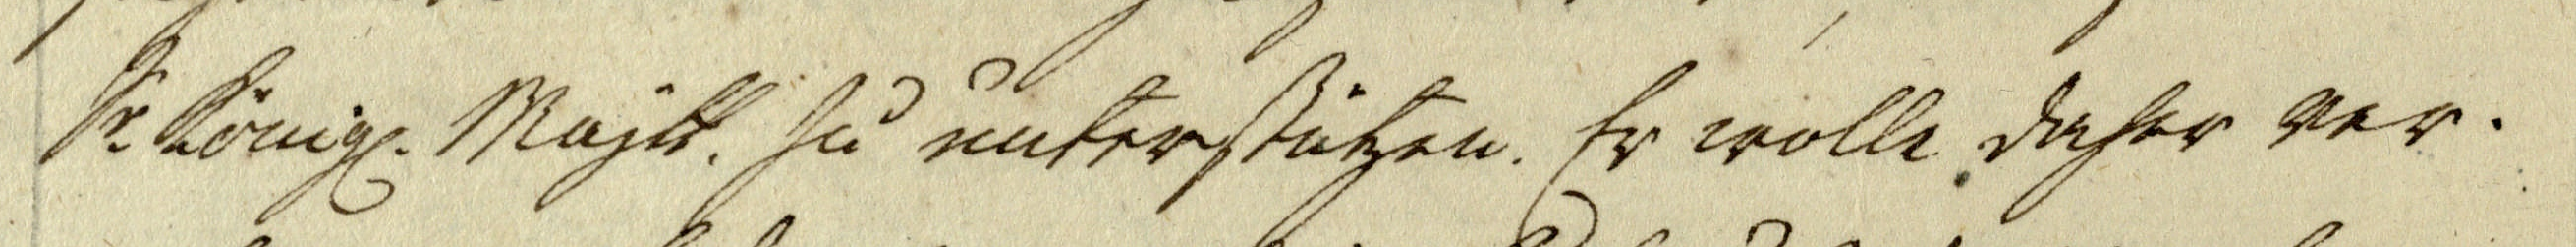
Sr Königl. Maÿtt zu unterstützen. Er wolle daher ver¬
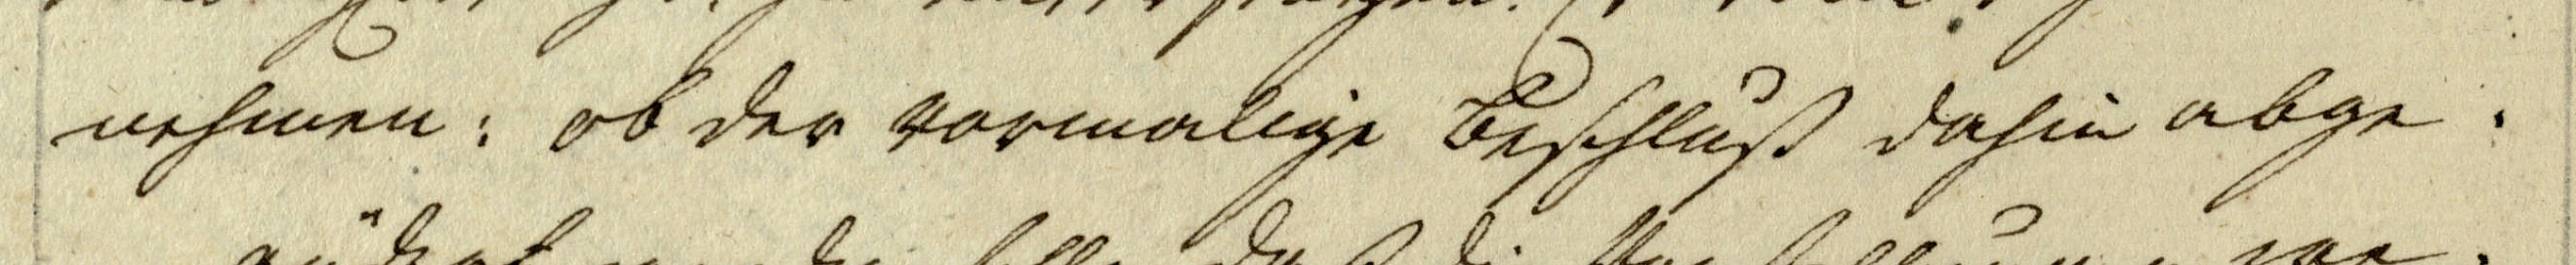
nehmen: ob der vormalige Beschluß dahin abge¬
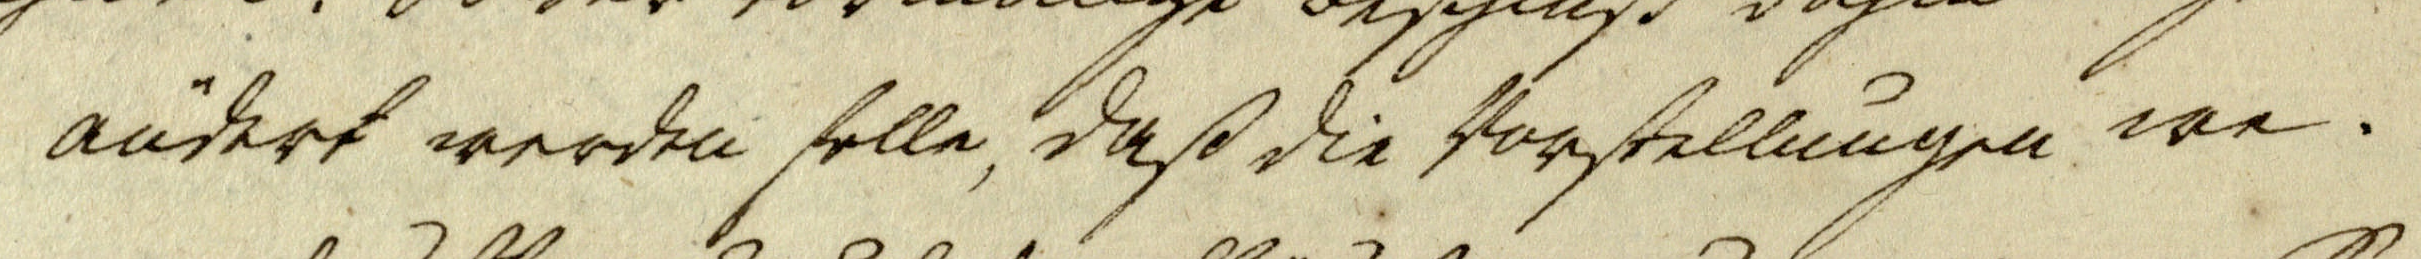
ändert werden solle, daß die Vorstellungen we¬
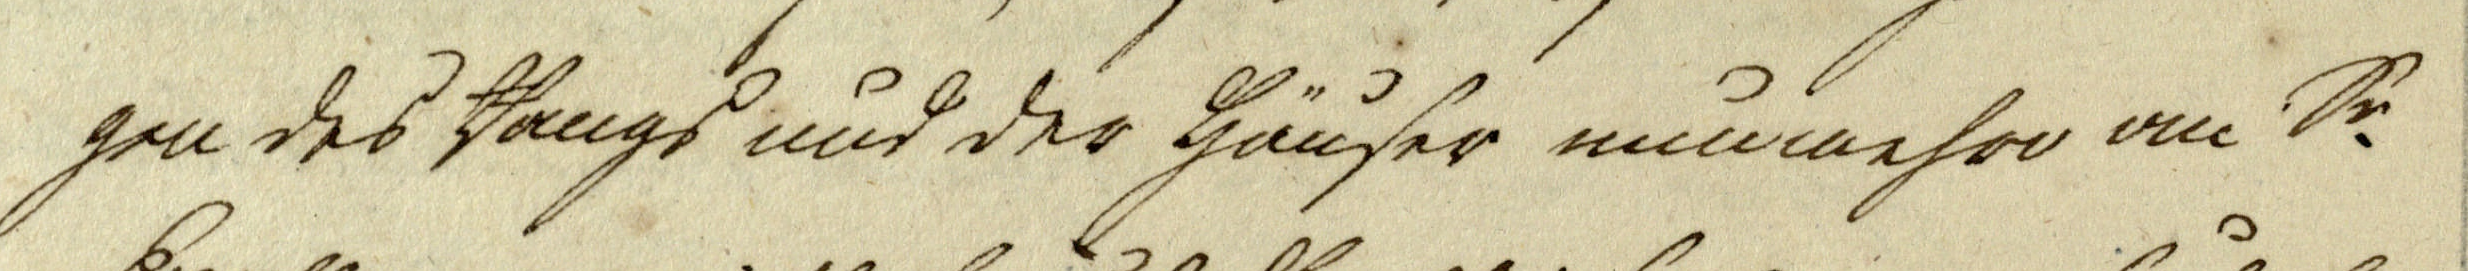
gen des Rangs und der Häuser nunmehro an Sr.
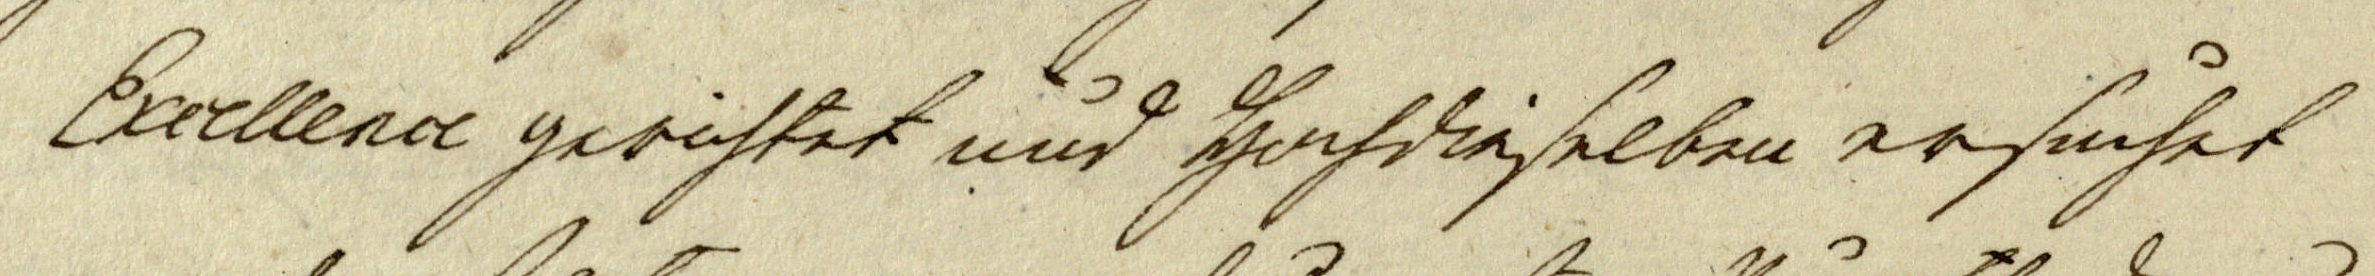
Excellence gerichtet und Hochdieselben ersuchet
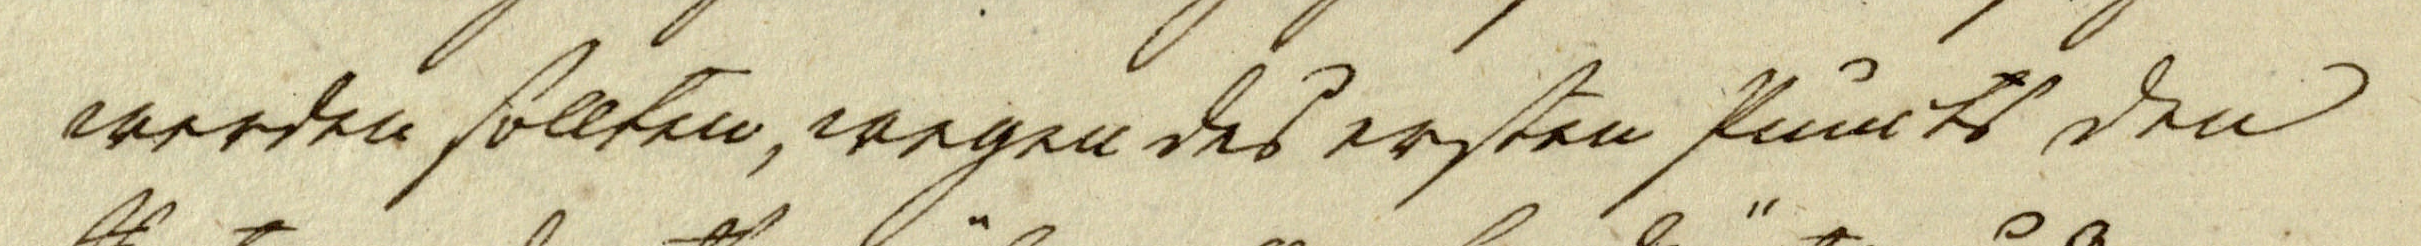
werden sollten, wegen des ersten Puncts den
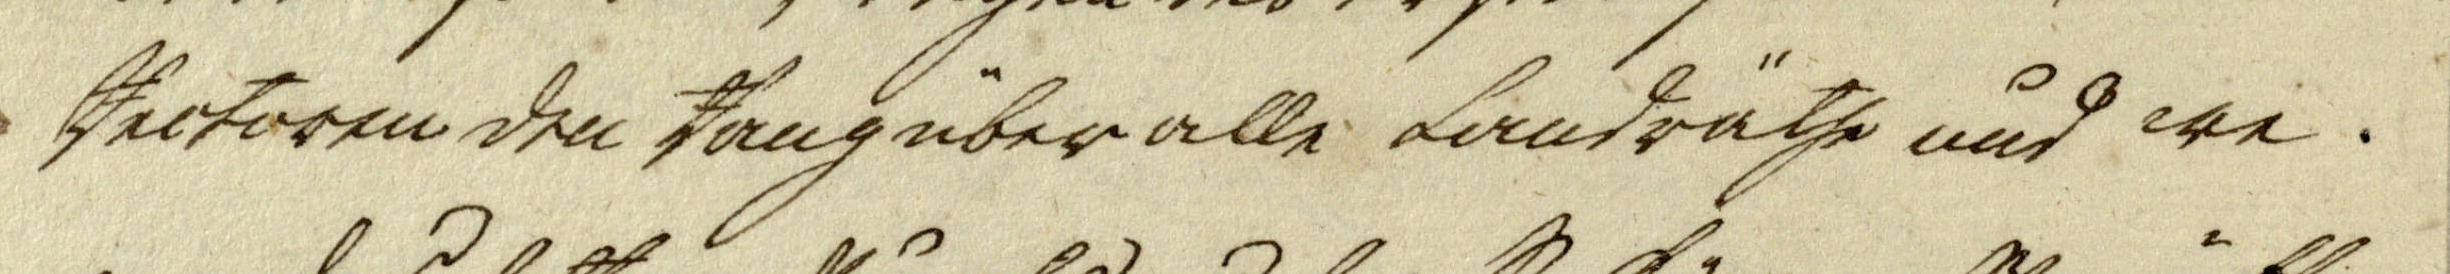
Rectoren den Rang über alle Landräthe und we¬
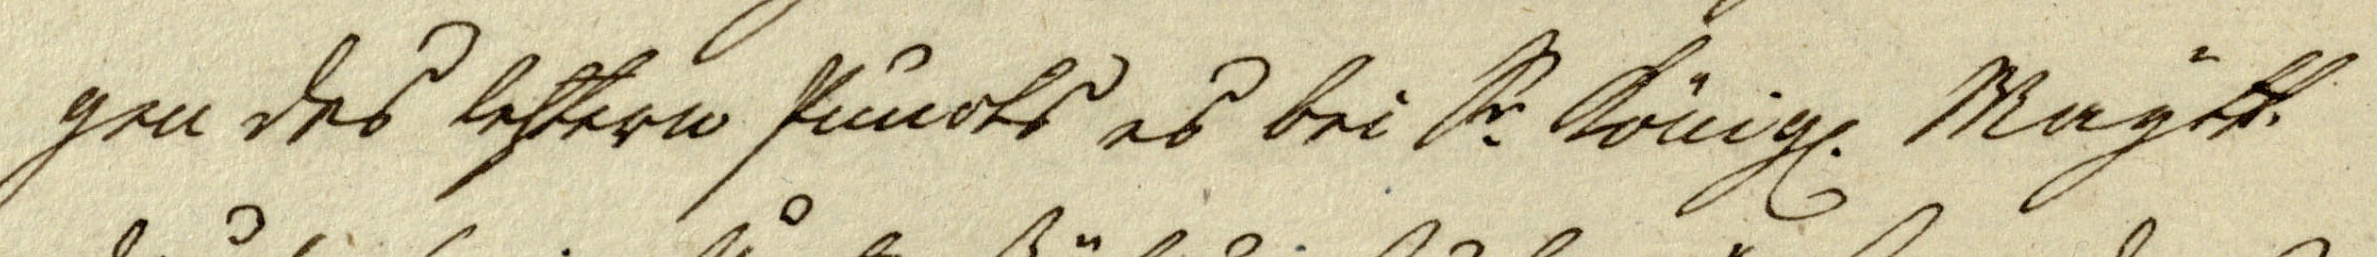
gen des letztern Puncts es bei Sr Königl. Maÿtt.
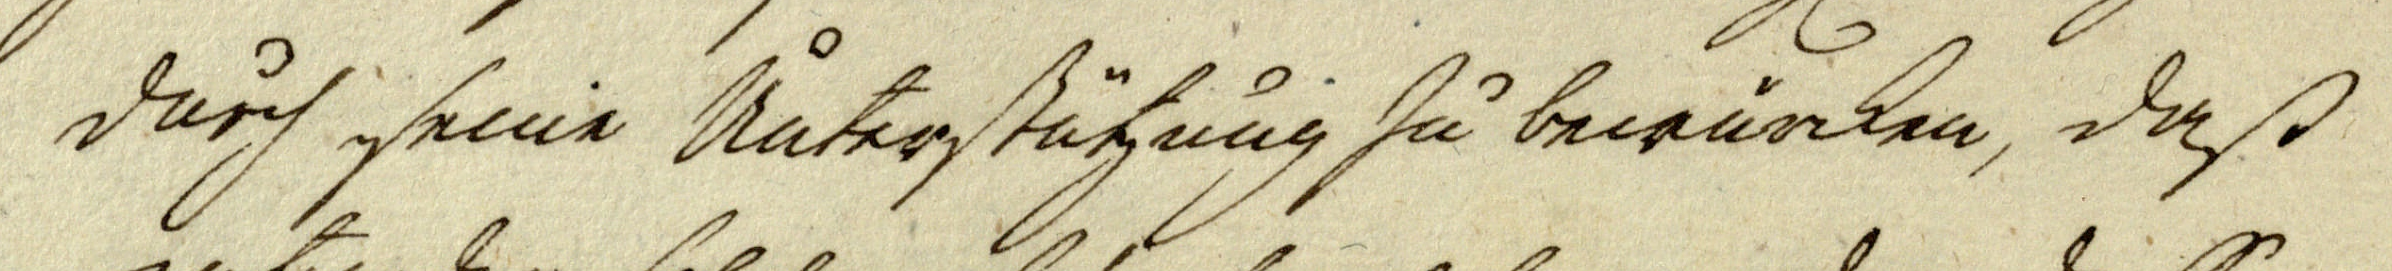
durch seine Unterstützung zu bewürcken, daß
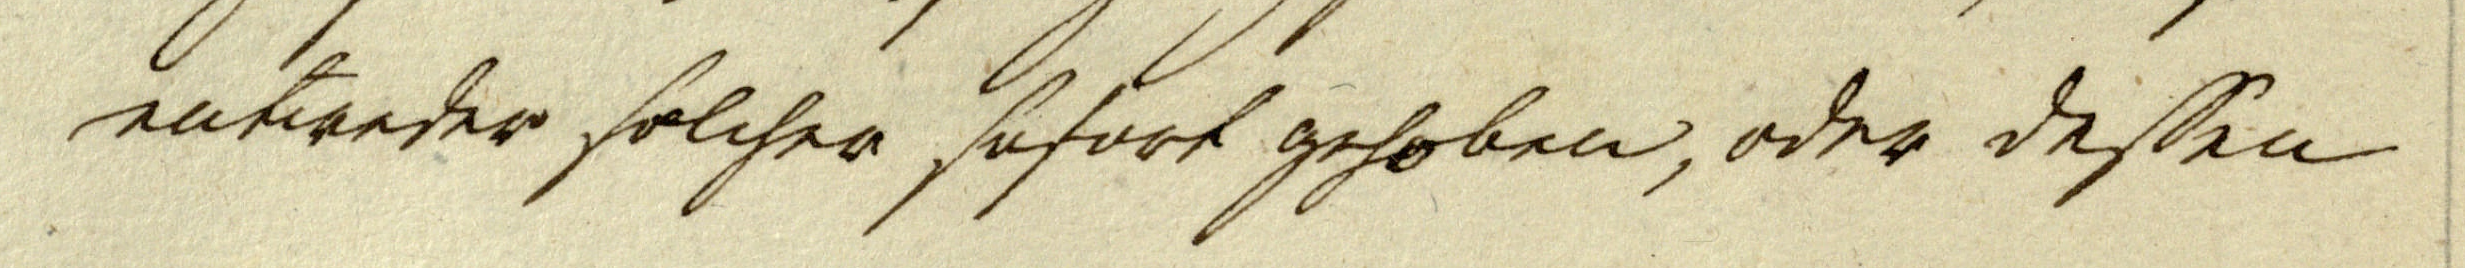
entweder solcher sofort gehoben, oder dessen
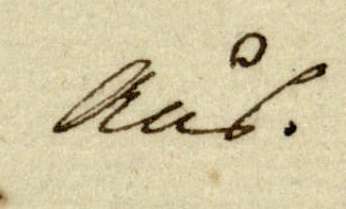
Aus¬
